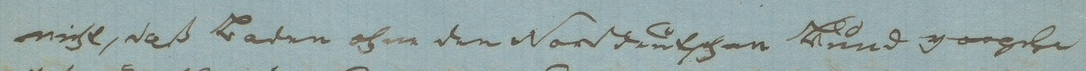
nicht, daß Baden ohne den Norddeutschen Bund vorgehe
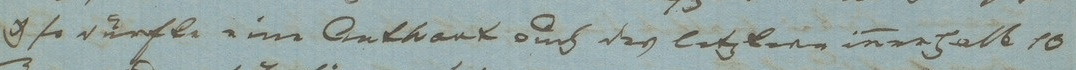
& so dürfte eine Antwort auch des letztern innerhalb 10
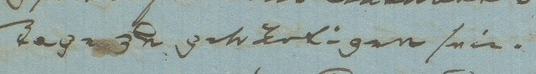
Tage zu gewärtigen sein.
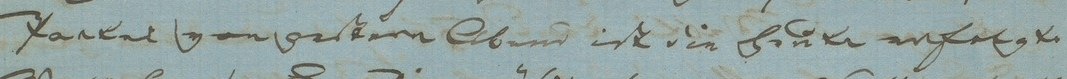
Partei von gestern Abend ist die heute erfolgte
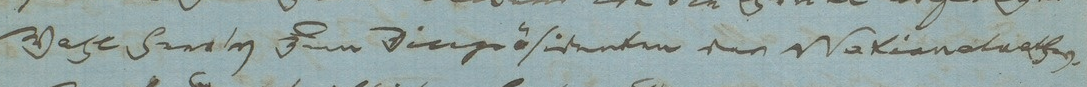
Wahl Heer's zum Vicepräsidenten des Nationalrathes.
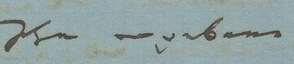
Ihr ergebene
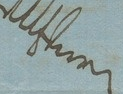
Bern
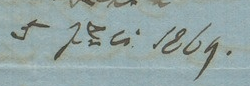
5 Juli 1869.
